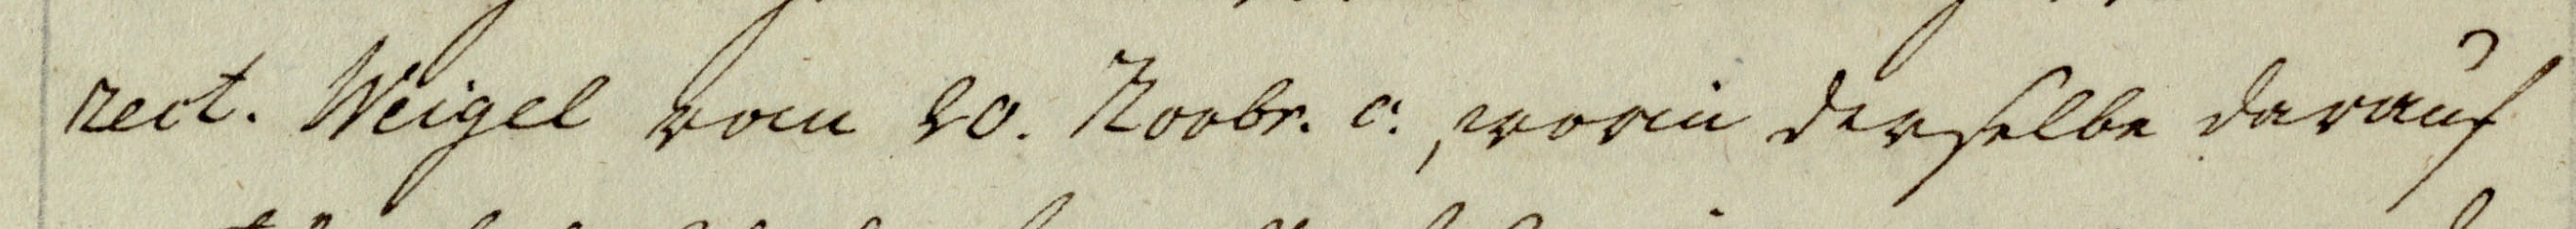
rect. Weigel vom 20. Novbr. c. worin derselbe darauf
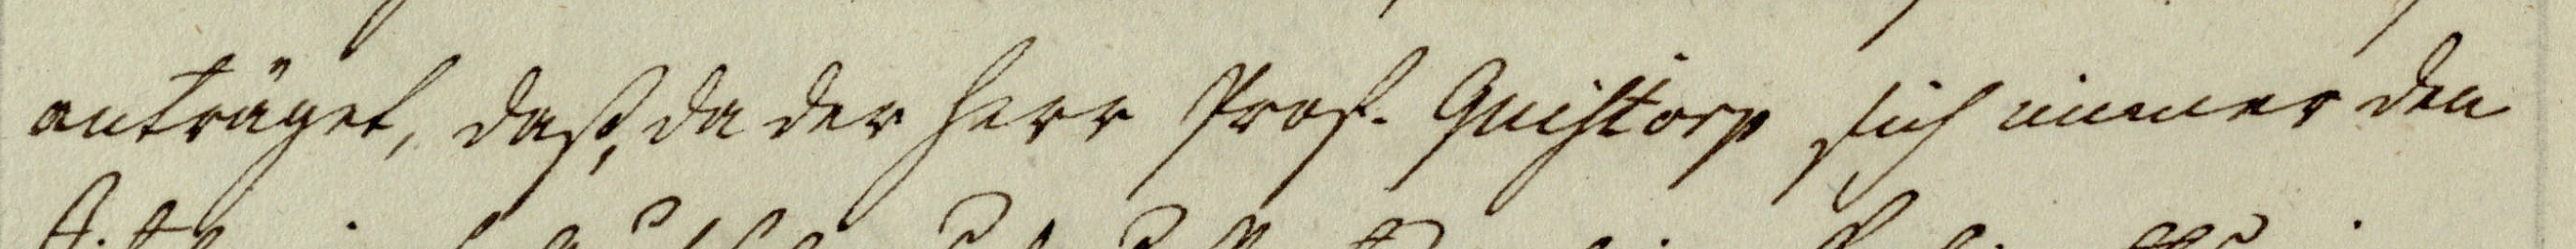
anträget, daß, da der Herr Prof. Quistorp sich immer den
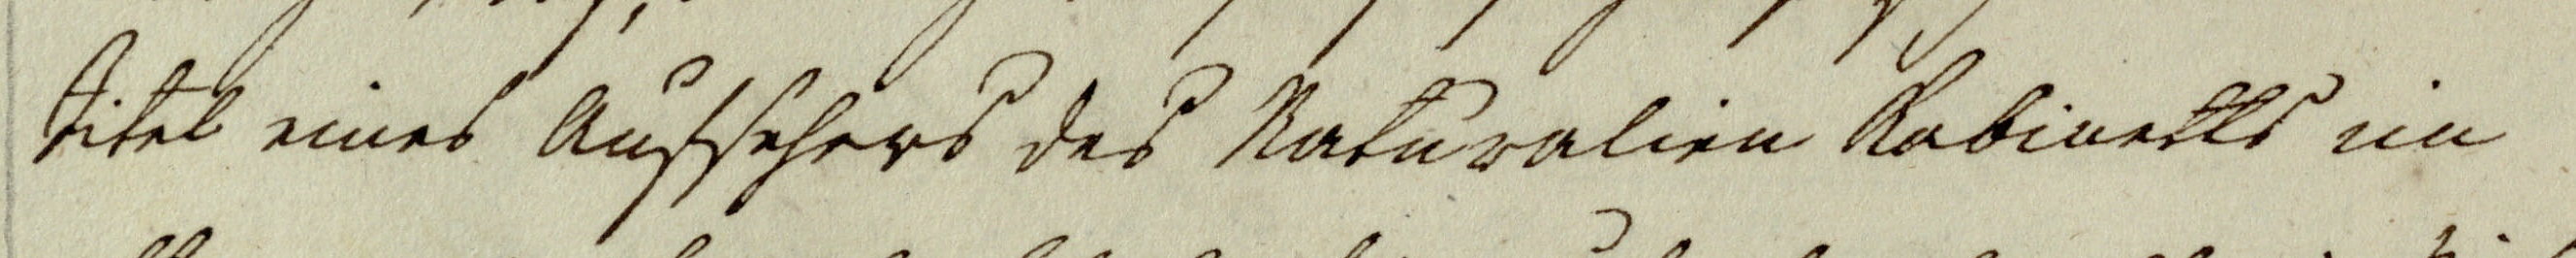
Titel eines Aufsehers das Naturalien Kabinetts im
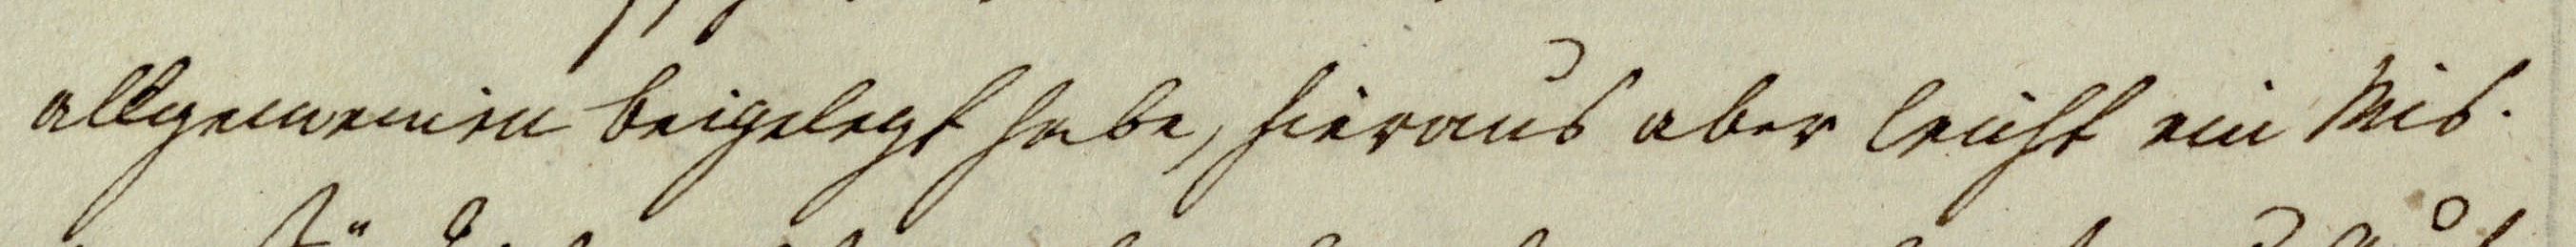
allgemeinen beigelegt habe, hieraus aber leicht ein Mis¬
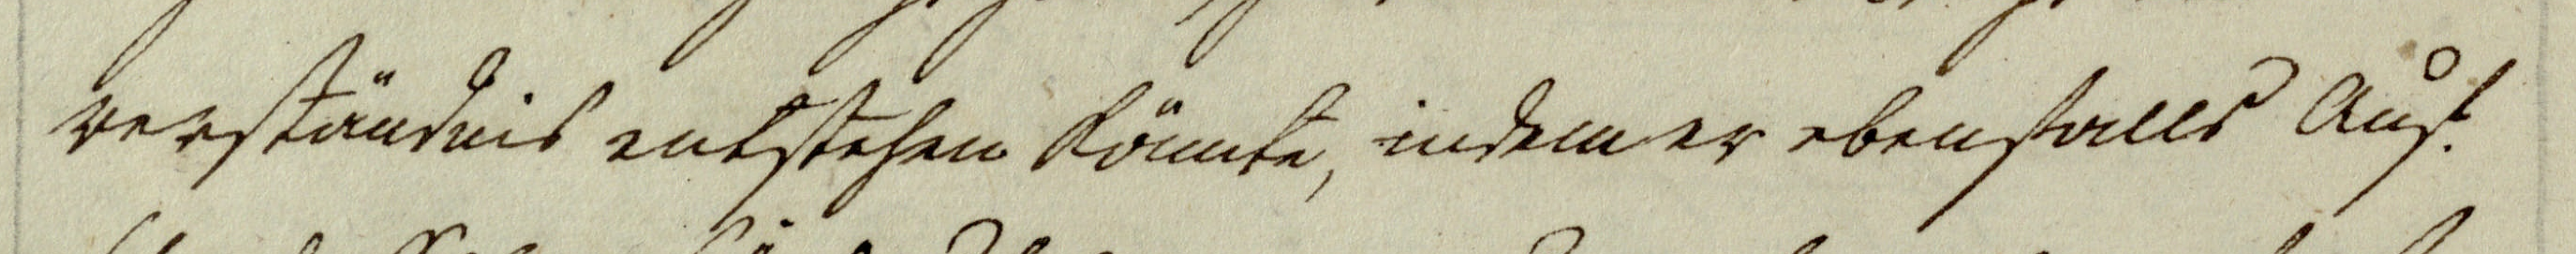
verständnis entstehen könnte, indem er ebenfalls Auf¬
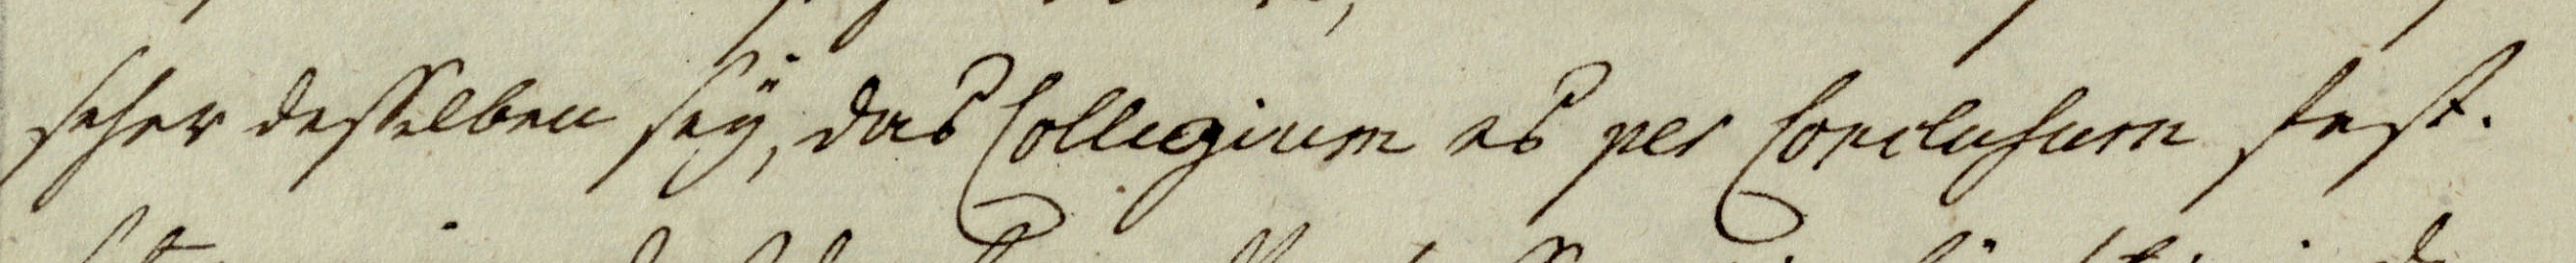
seher desselben seÿ, das Collegium es per Conclusum fest¬
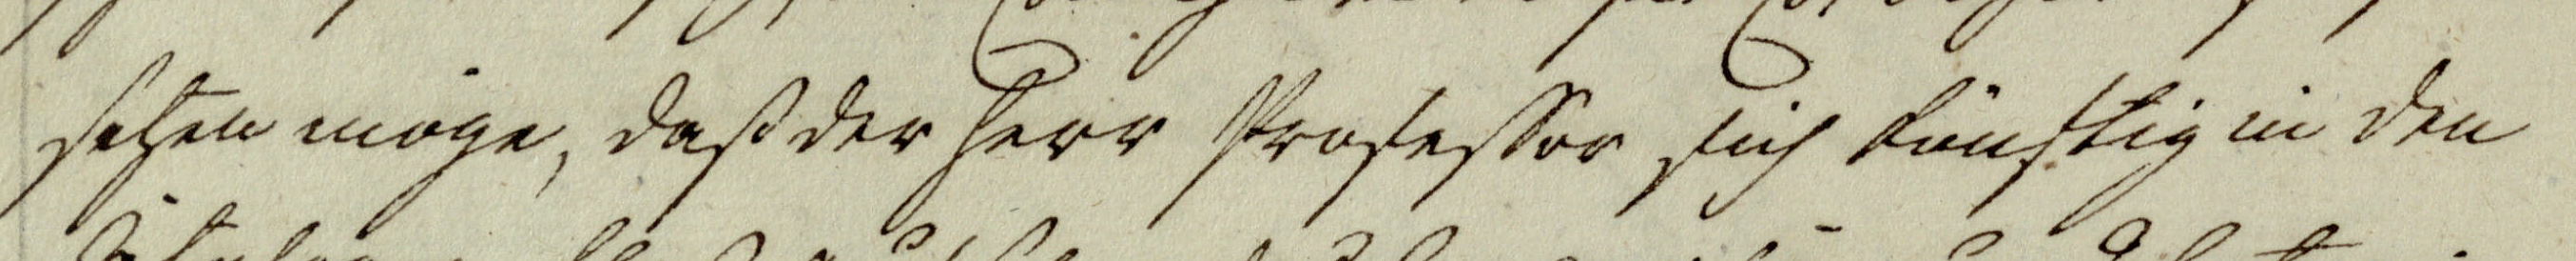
setzen möge, daß der Herr Professor sich künftig in den
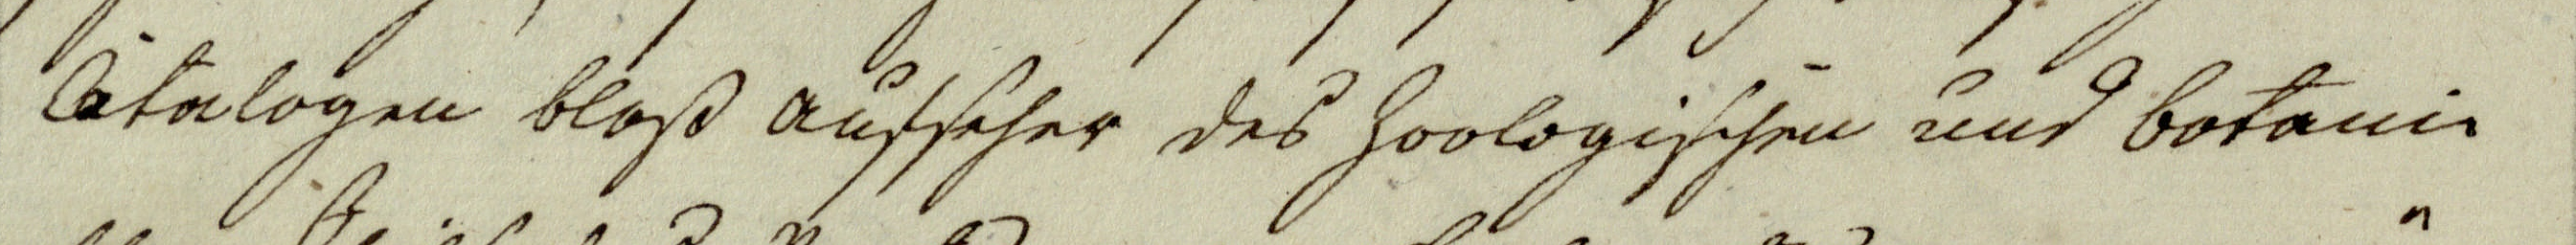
Catalogen bloß Aufseher des zoologischen und botani¬
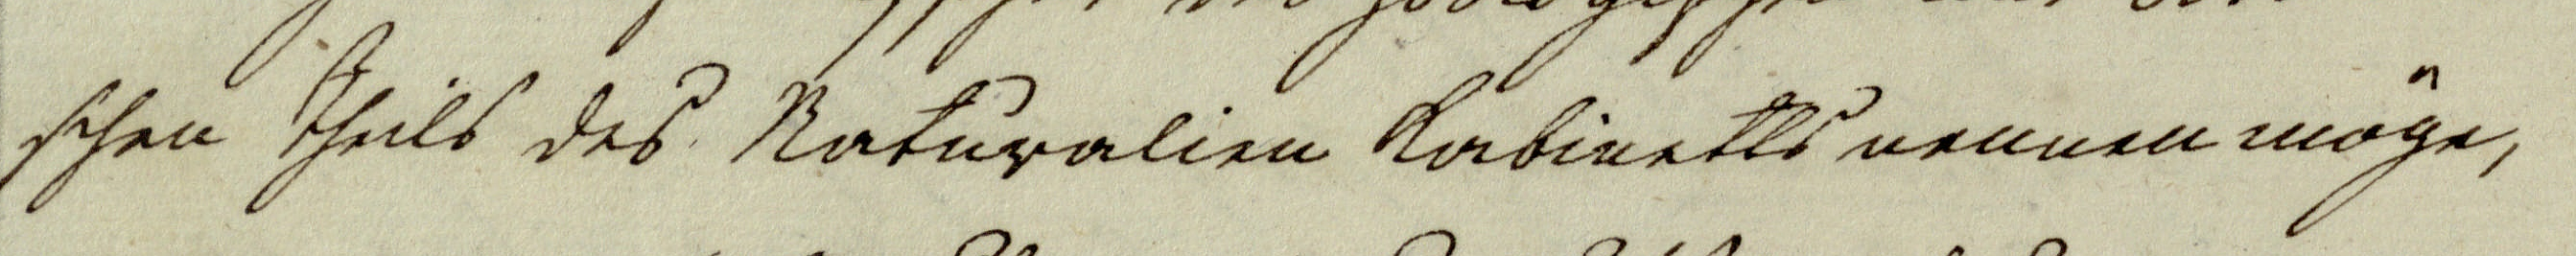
schen Theils des Naturalien Kabinetts nennen möge,
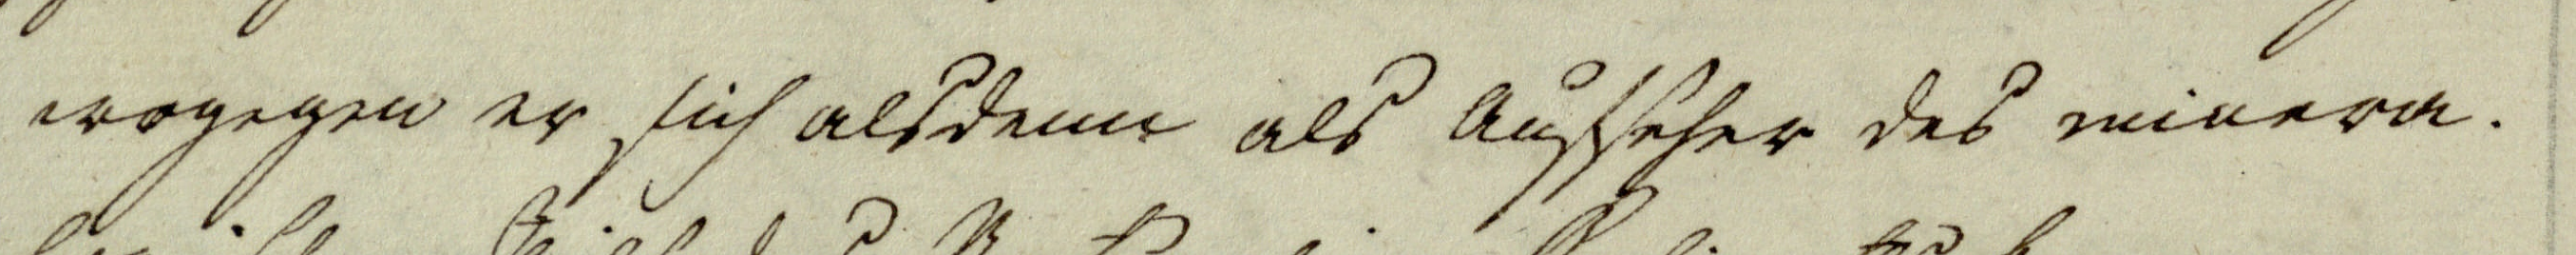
wogegen er sich alsdenn als Aufseher des minera¬
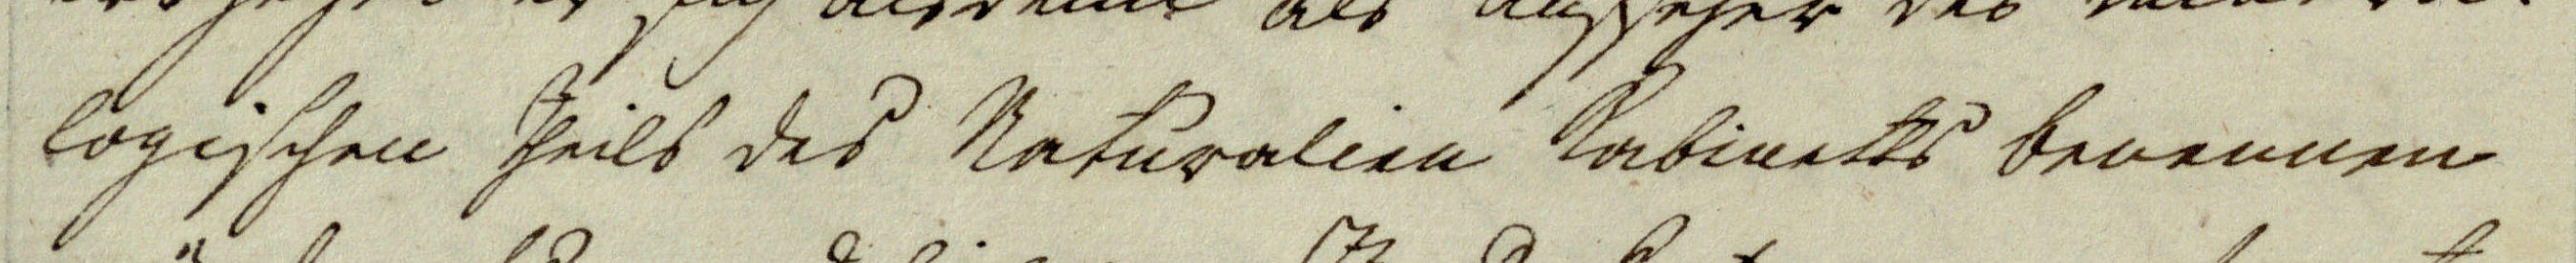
logischen Theils des Naturalien Kabinetts benennen
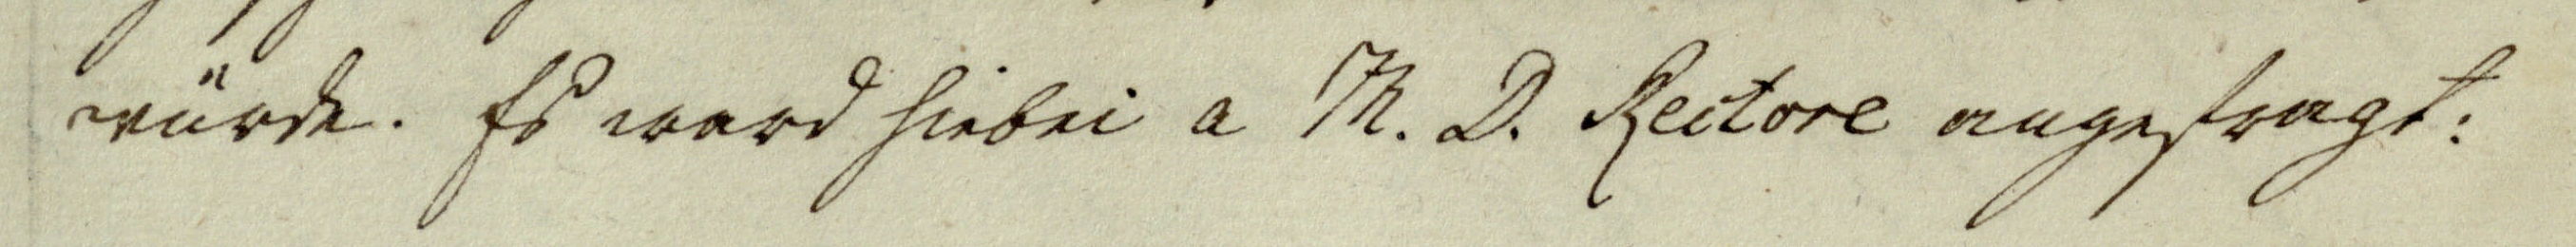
würde. Es ward hiebei a M. D. Rectore angefragt:
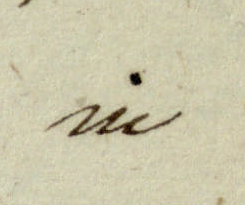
in
